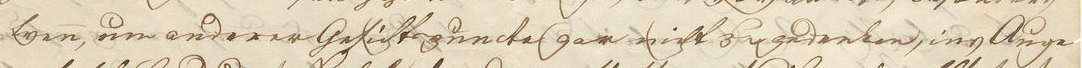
wenn, um anderer Gesichtspuncte gar nicht zu gedenken, ins Auge
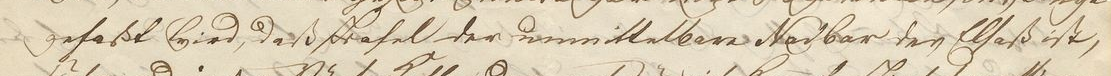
gefaßt wird, daß Basel der unmittelbare Nachbar des Elsaß ist,
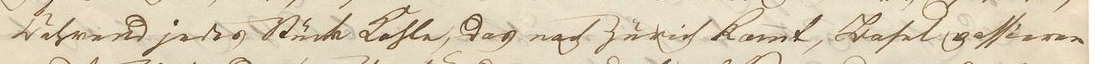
während jedes Stück Kohle, das nach Zürich kommt, Basel passieren
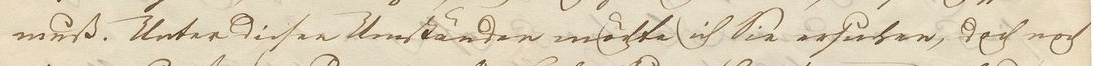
muß. Unter diesen Umständen möchte ich Sie ersuchen, doch noch
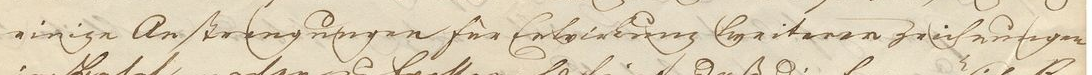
einige Anstrengungen für Erwirkung weiterer Zeichnungen
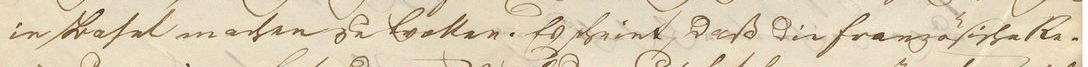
in Basel machen zu wollen. Es scheint, daß die französische Re-
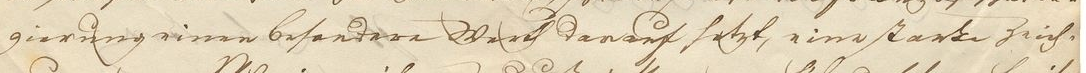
gierung einen besondern Werth darauf setzt, eine starke Zeich-
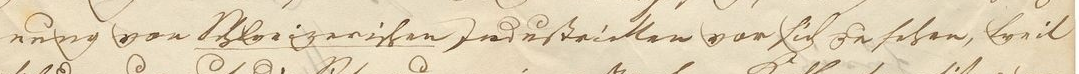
nung von Schweizerischen Industriellen vor sich zu sehen, weil
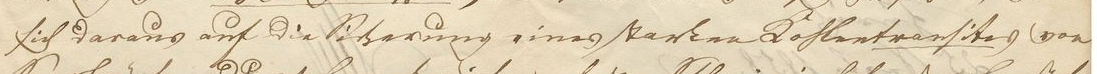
sich daraus auf die Sicherung eines starken Kohlentransites von
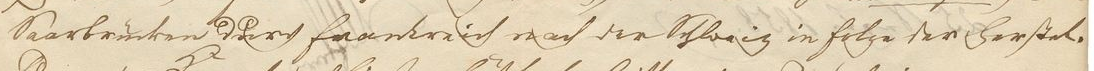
Saarbrücken durch Frankreich nach der Schweiz in Folge der Herstel-
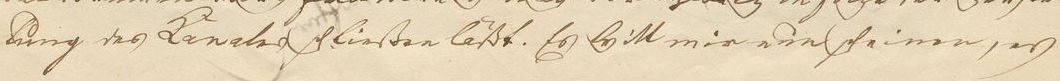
lung des Kanales schließen läßt. Es will mir nun scheinen, es
